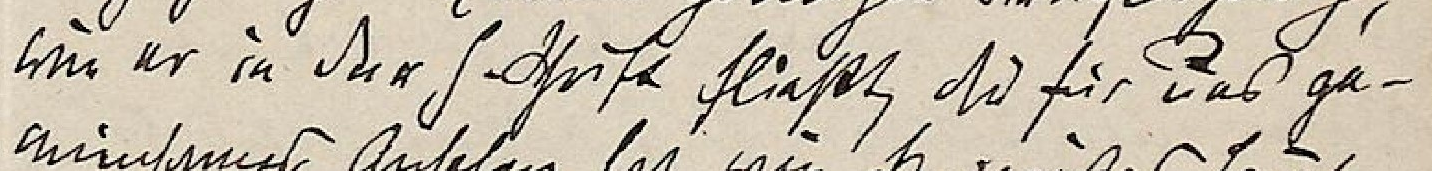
wie er in durch Schrift fließt, die für uns ge¬
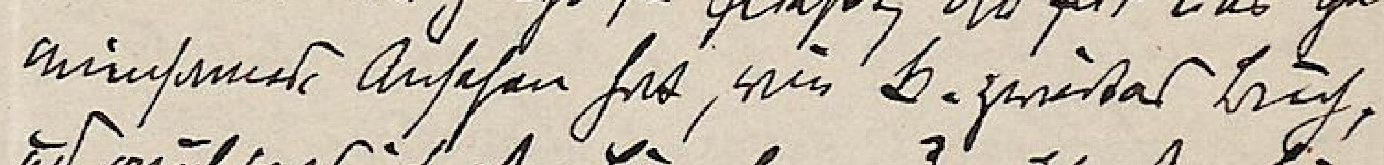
meinsames Ansehen hat, wie k. zweites Buch
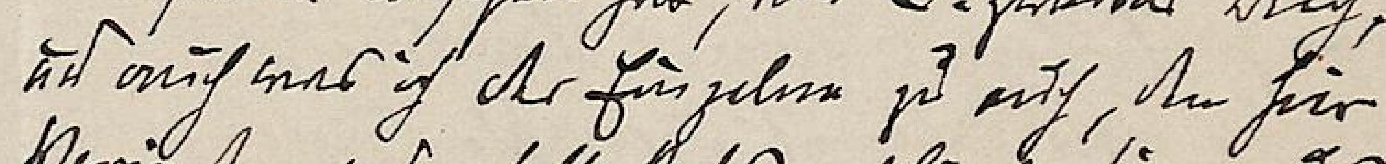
und auch was ich der Einzelne zu euch, den hier
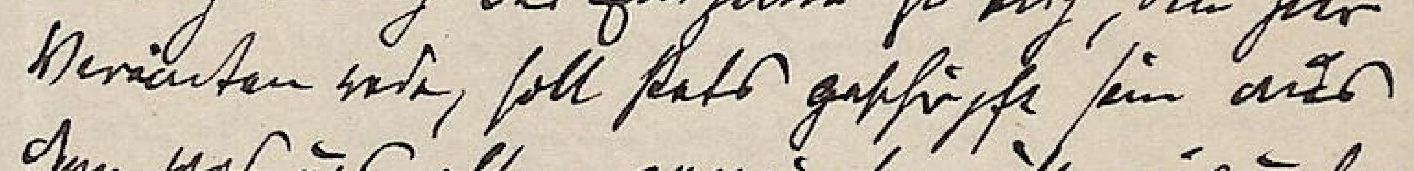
Vereinten rede, soll stets geschöpf sein aus
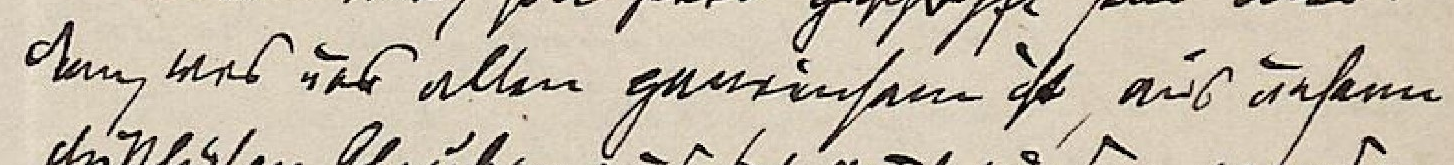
dem, was uns allen gemeinsam ist, aus unserm
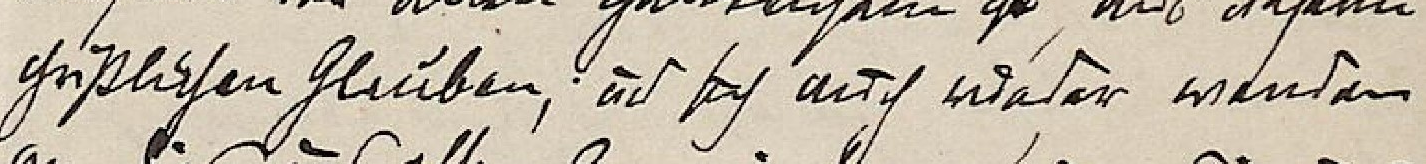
christlichen Glauben, und sich auch wieder wenden
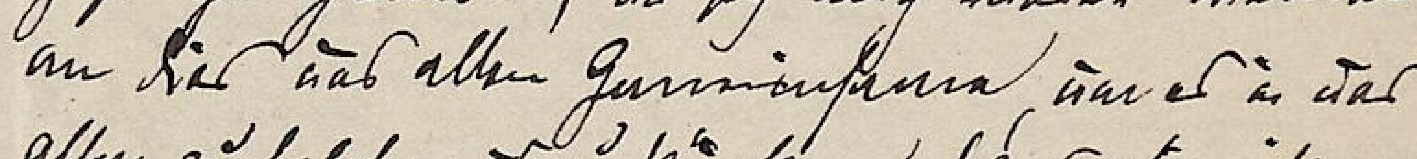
an dies uns allen Gemeinsame, um es in uns
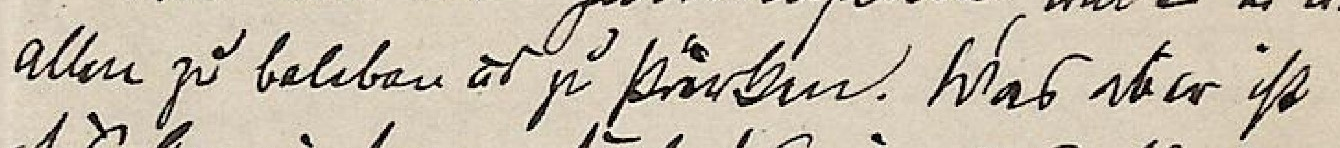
allen zu beleben und zu stärken. Was aber ist
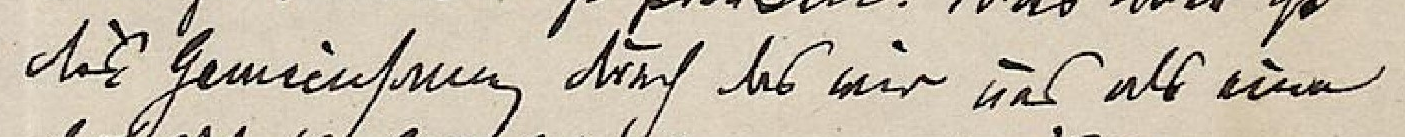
dies Gemeinsame, durch das wir uns als einen
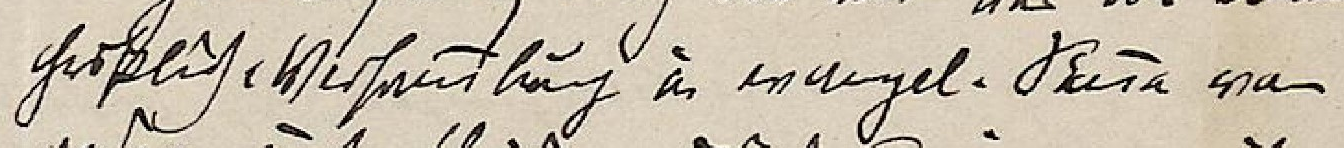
christliche Versamlung in evangel. Sine von
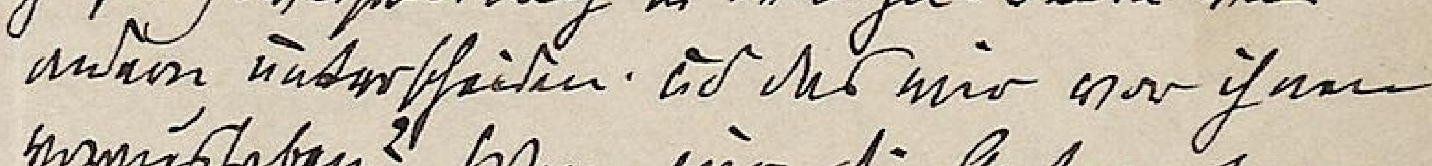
anderen unterscheiden. und das wir vor ihnen
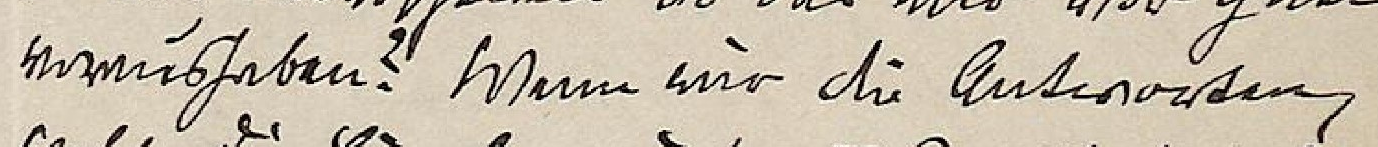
voraushaben? Wenn wir die Antworten,
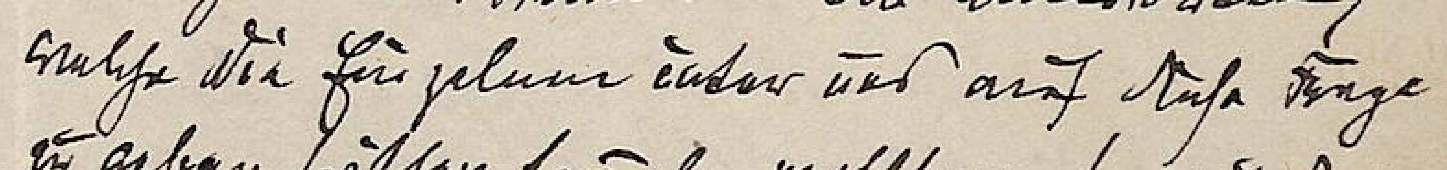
welche die Einzelnen unter uns auf diese Frage
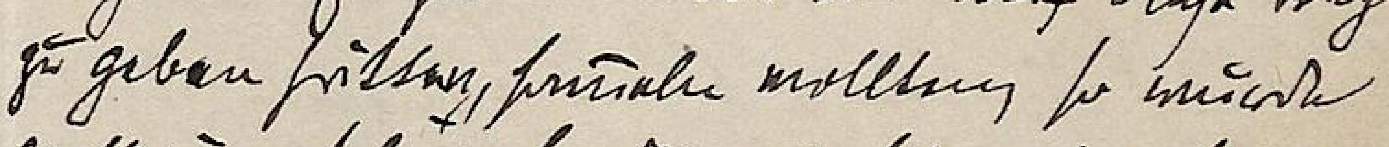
zu geben hätten, sammeln wollten, so würde
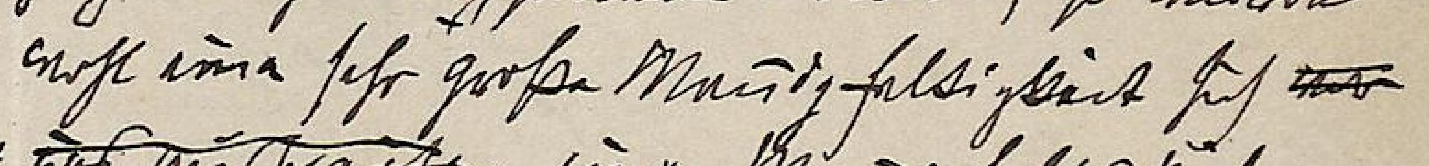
wohl eine sehr großen Manigfaltigkeits sich vor
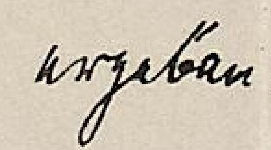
ergeben
